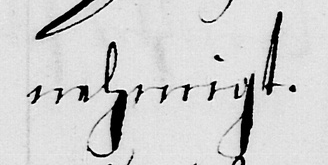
nehmigt.
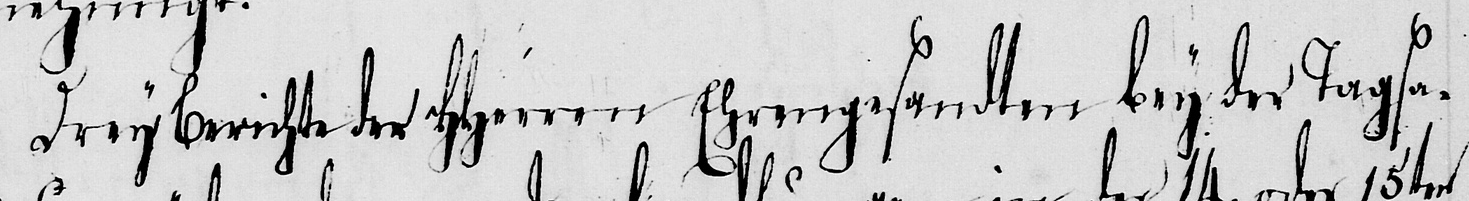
Drey Berichte der HHerren Ehrengesandten bey der Tagsa¬
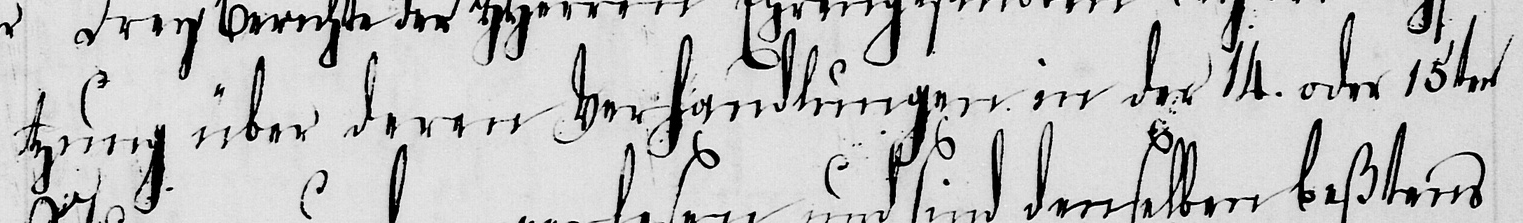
tzung über deren Verhandlungen in der 14. oder 15ten
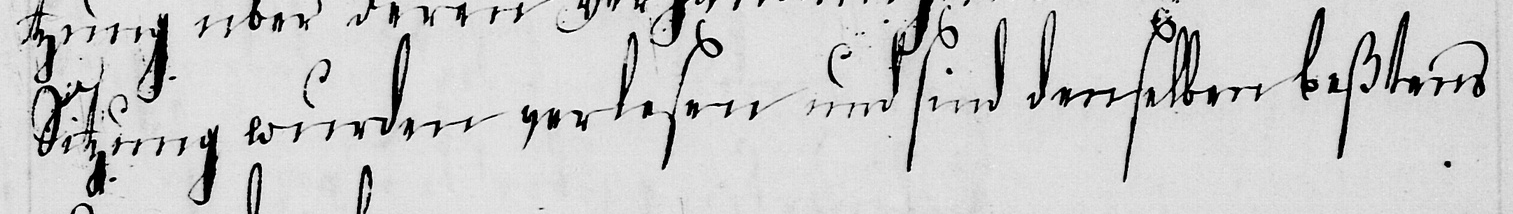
Sitzung wurden verlesen und sind denselben beßtens
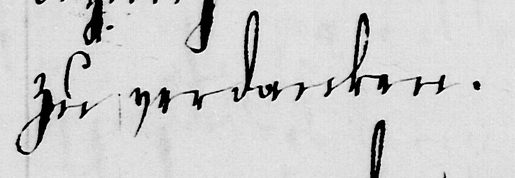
zu verdanken.
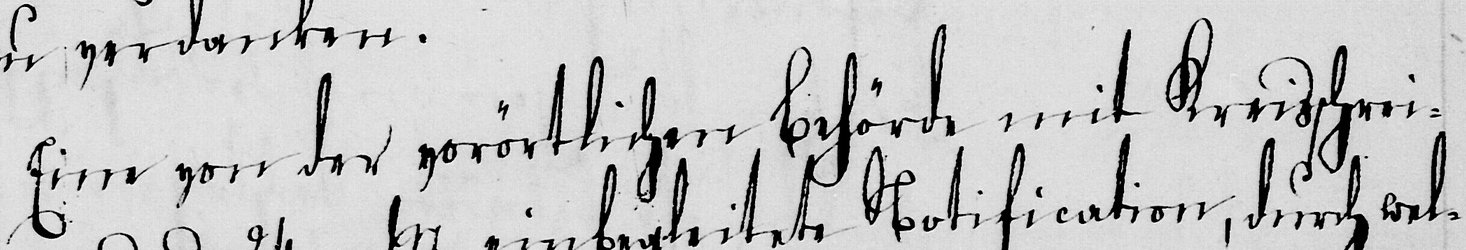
Eine von der vorörtlichen Behörde mit Kreisschrei¬
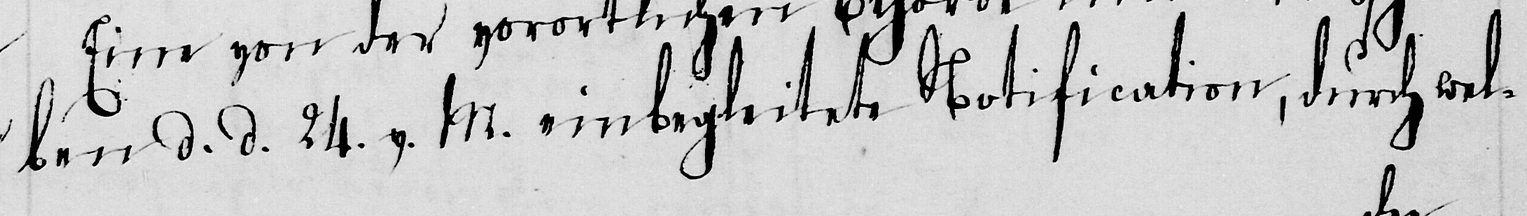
ben d. d. 24. v. M. einbegleitete Notification, durch wel-
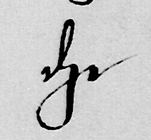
de
